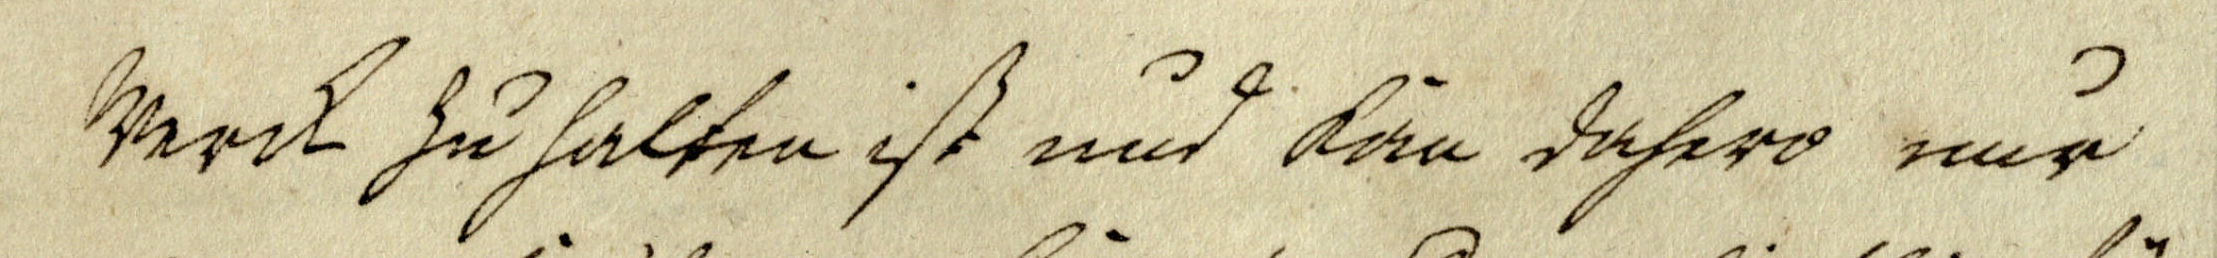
Werck zu halten ist und kan dahero nur
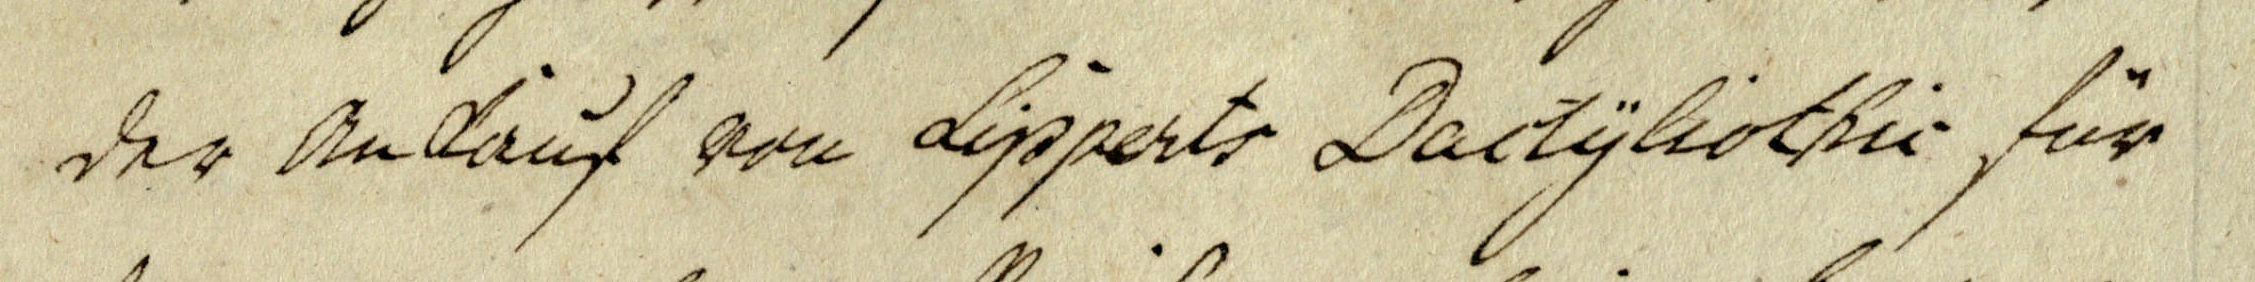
der Ankauf von LippertsDactÿliothic für
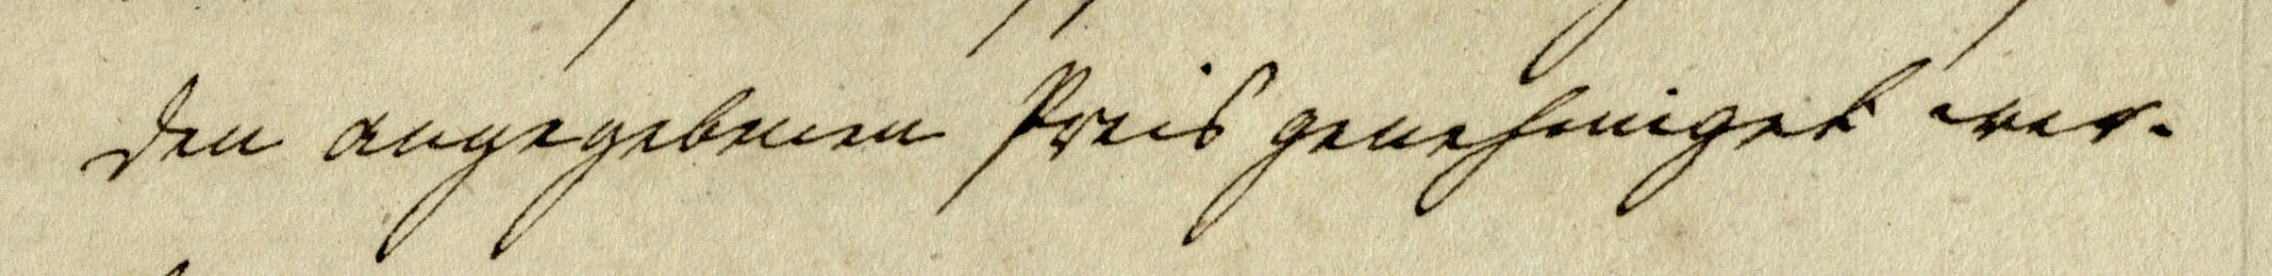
den angegebenen Preis genehmiget wer¬
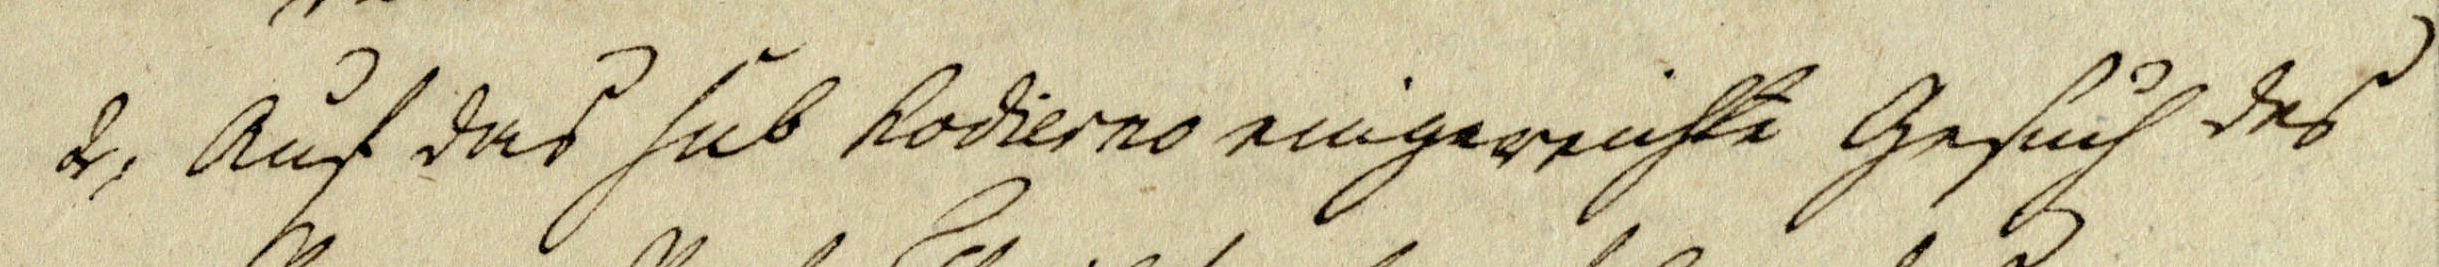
2, Auf das sub hodierno eingereichte Gesuch des
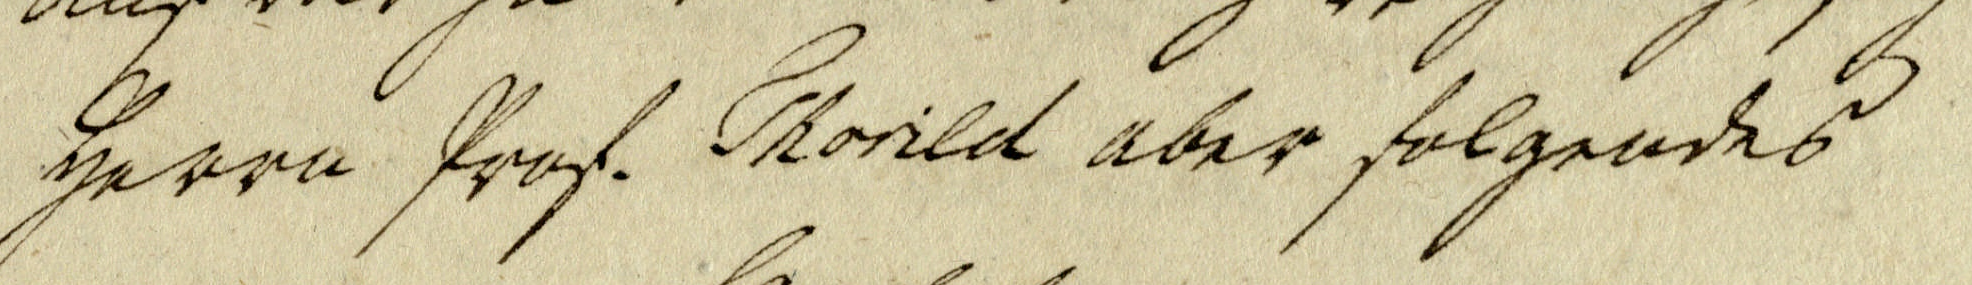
Herrn Prof. Thorild aber folgendes
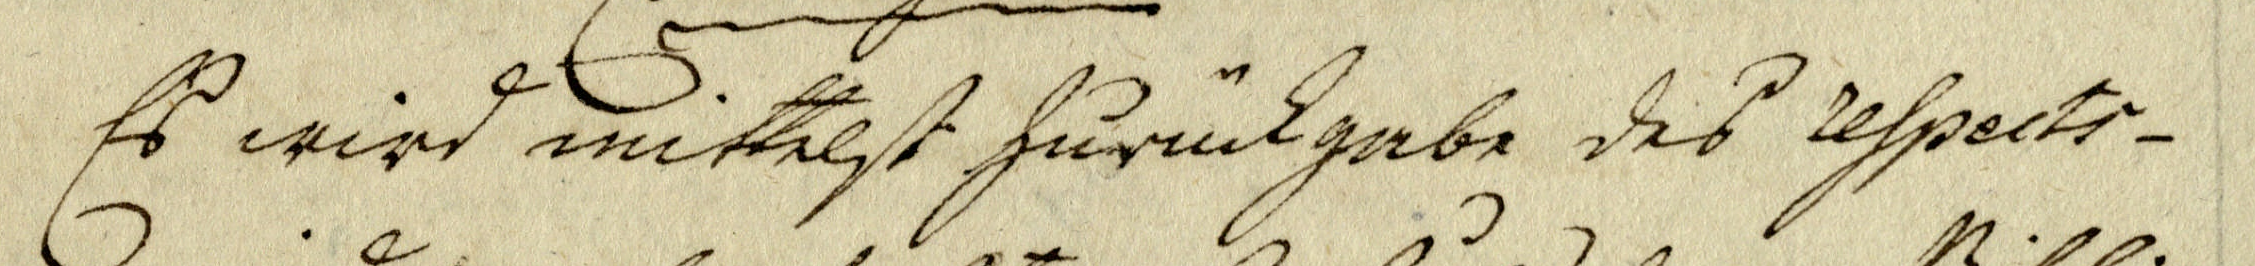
Es wird mittelst Zurückgabe des respects¬
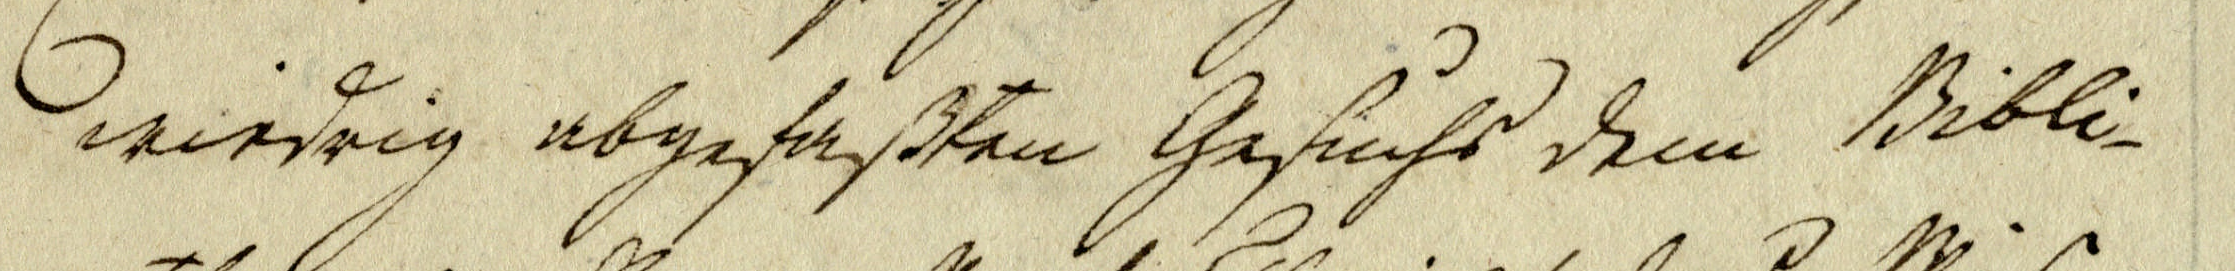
wiedrig abgefaßten Gesuchs dem Bibli
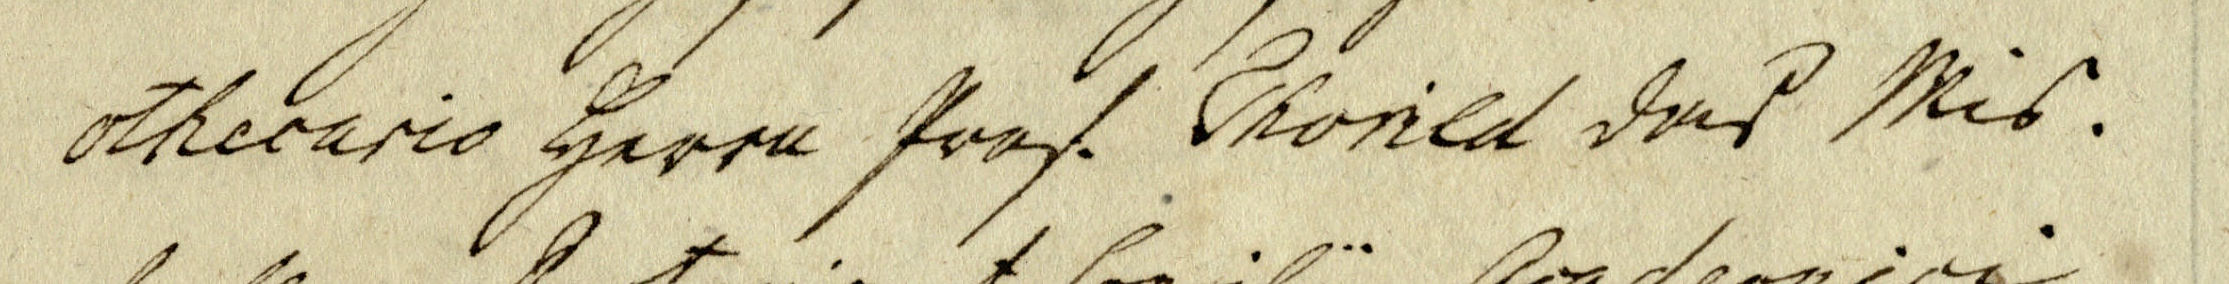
othecario Herrn Prof. Thorild das Mis¬
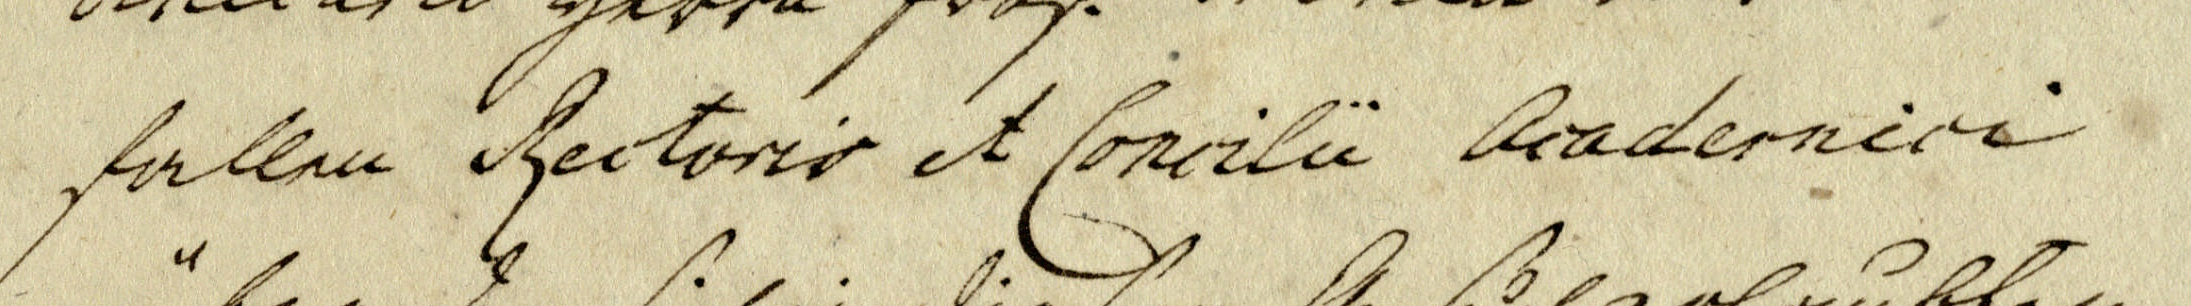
fallen Rectoris et Concilii Academici
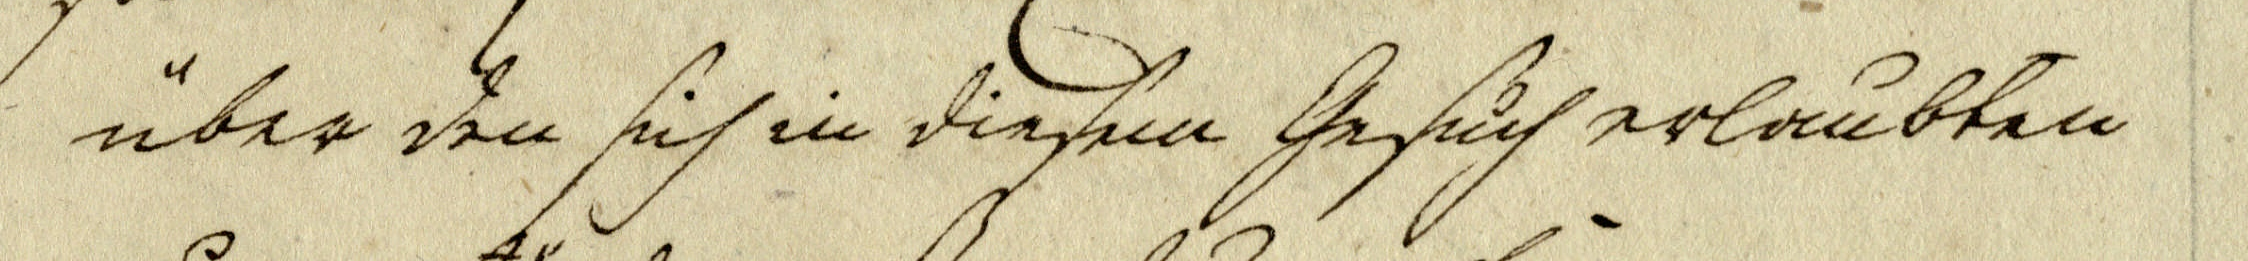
über den sich in diesem Gesuch erlaubten
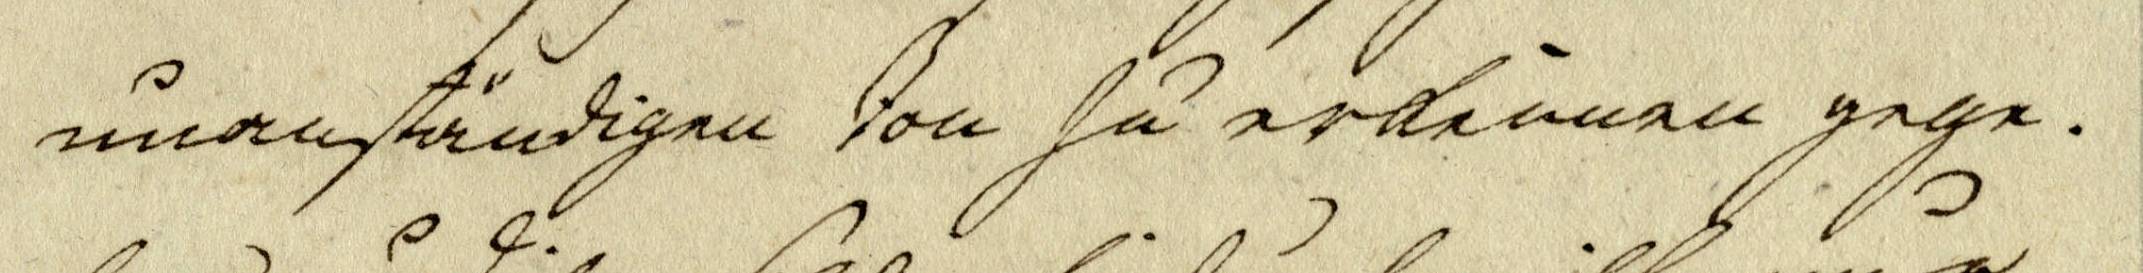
unanständigen Ton zu erkennen gege¬
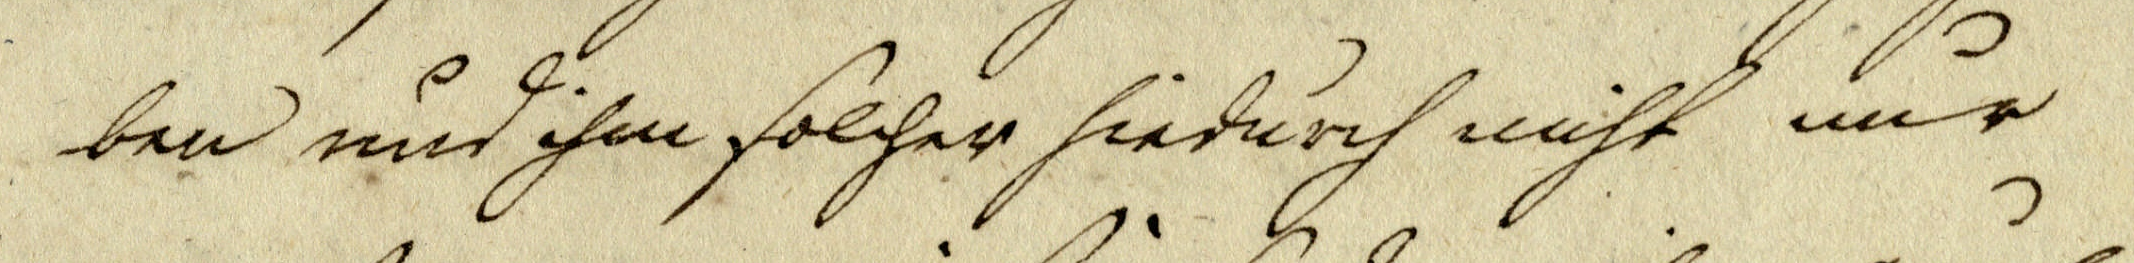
ben und ihm solcher hiedurch nicht nur
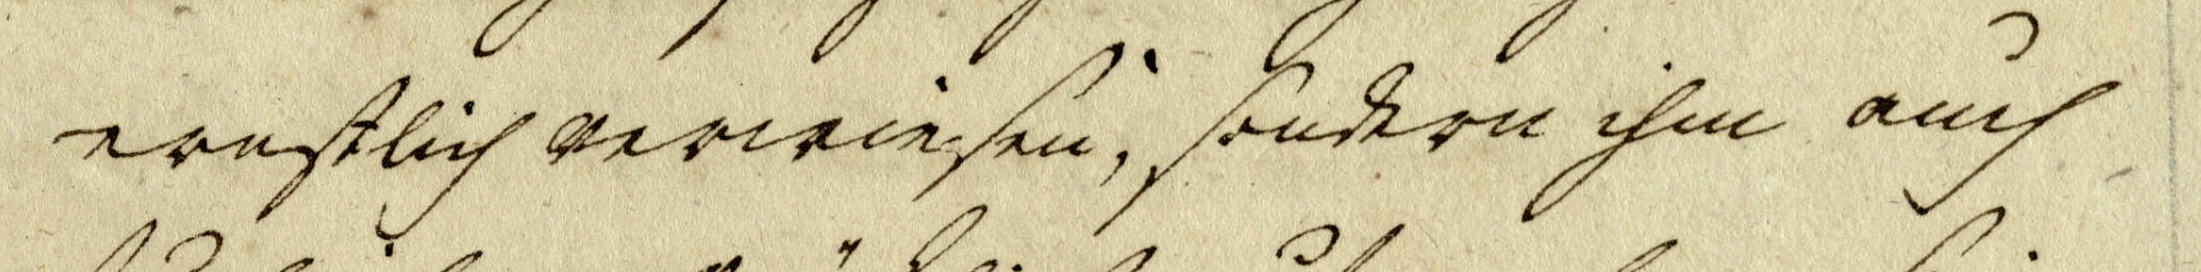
ernstlich verwiesen, sondern ihm auch
